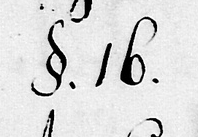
§. 16.
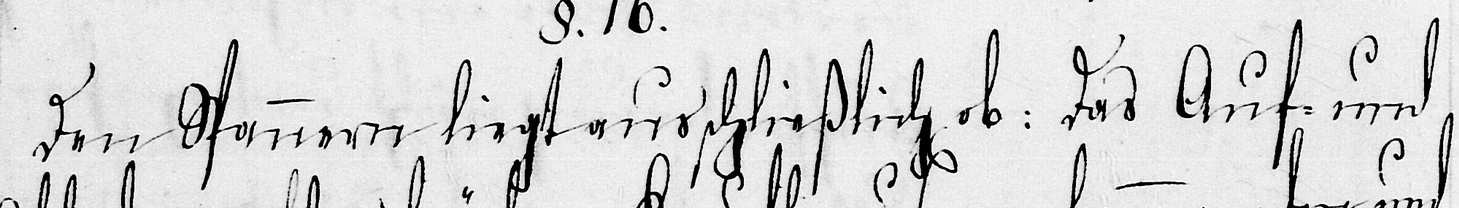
Den Spannern liegt ausschließlich ob: Das Auf- und
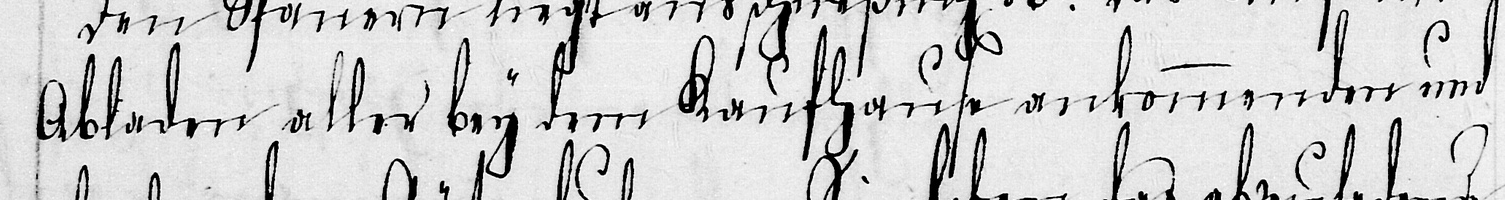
Abladen aller bey dem Kaufhause ankommenden und
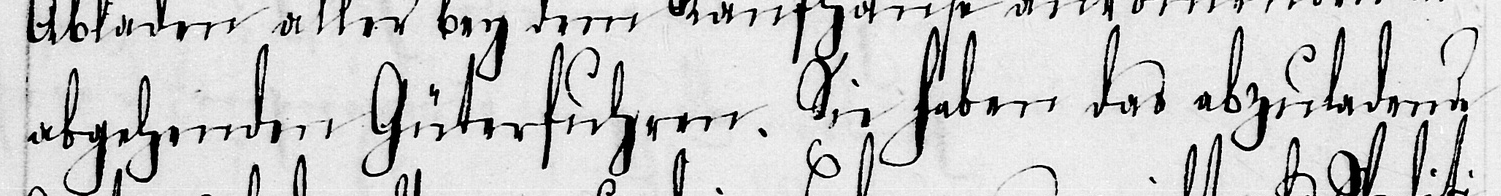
abgehenden Güterfuhren. Sie haben das abzuladende
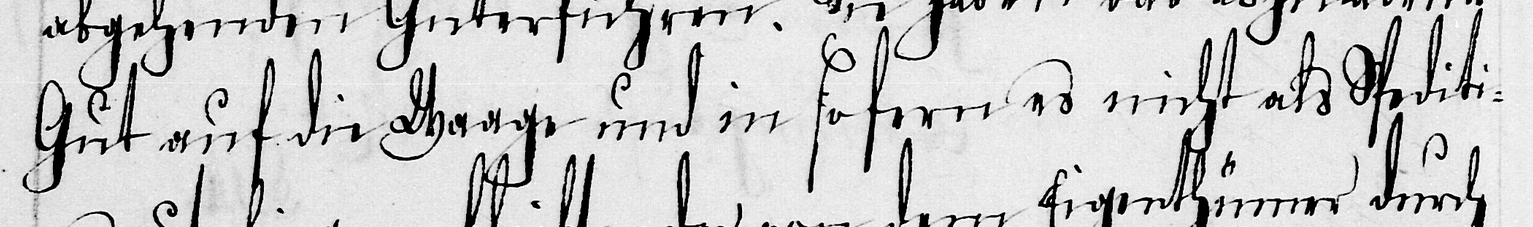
Gut auf die Waage und in so fern es nicht als Spedit¬
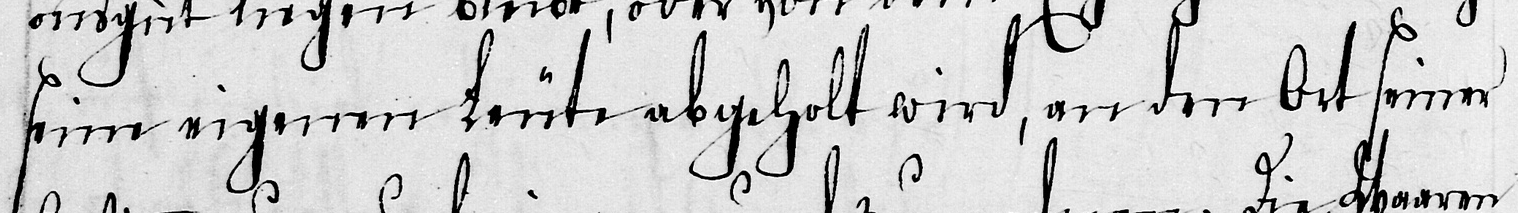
seine eigenen Leute abgeholt wird, an den Ort seiner
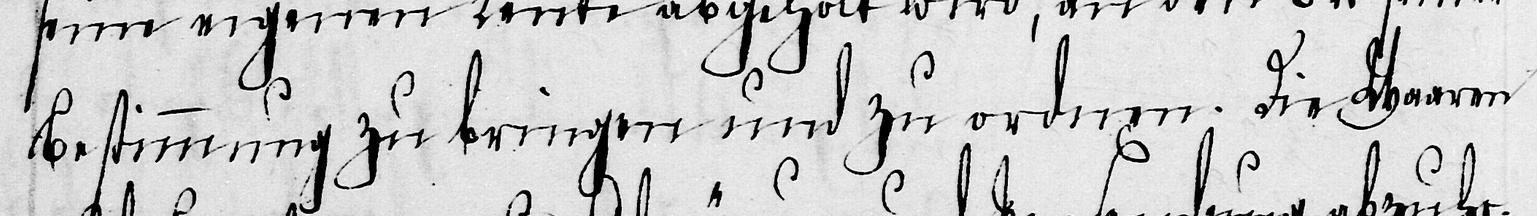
Bestimmung zu bringen und zu ordnen. Die Waaren
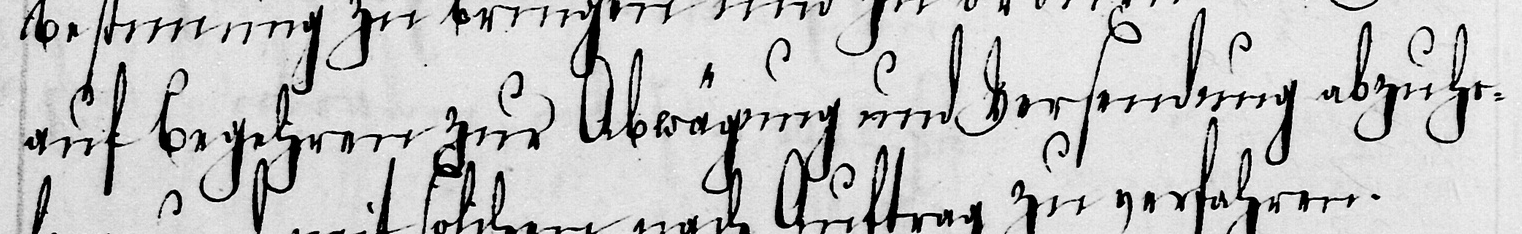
auf Begehren zur Abwägung und Versendung abzuho¬
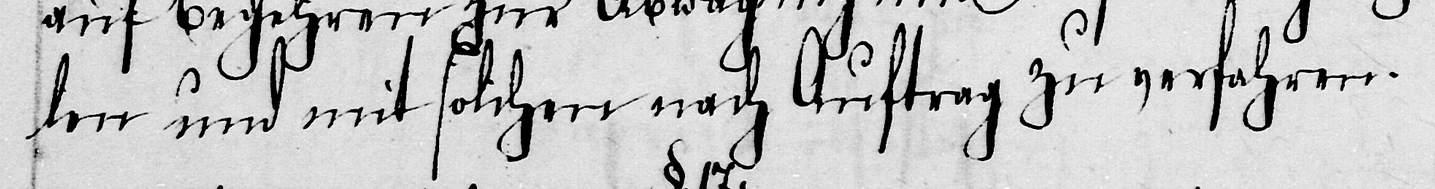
len und mit solchen nach Auftrag zu verfahren.
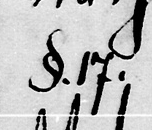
§. 17.
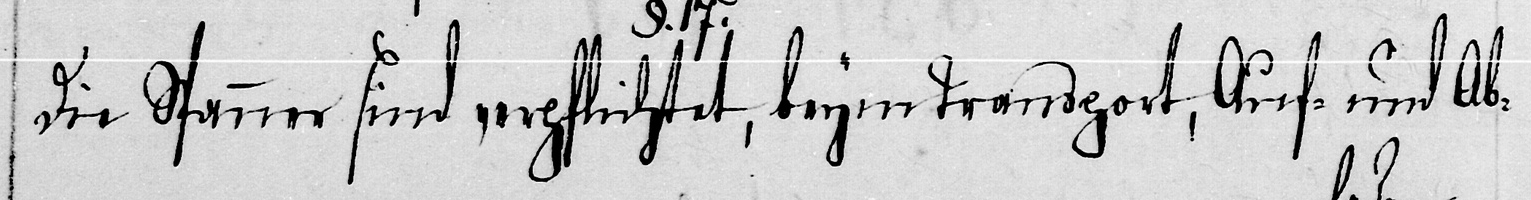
Die Spanner sind verpflichtet, beym Transport, Auf- und Ab-
